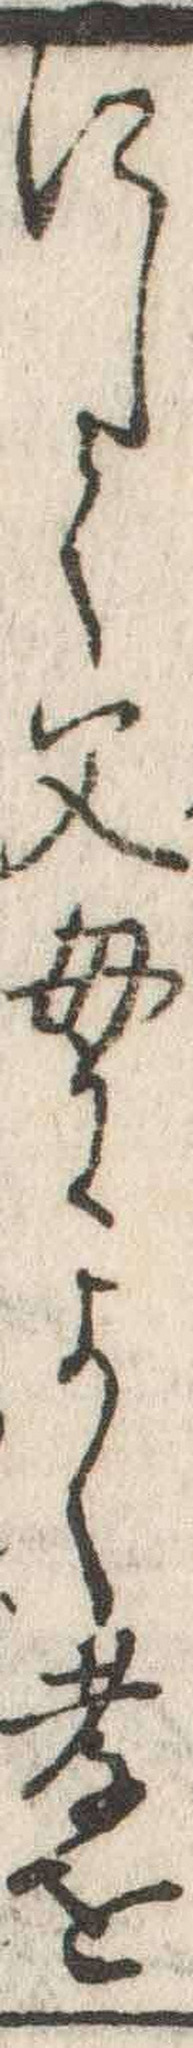にして父母によく孝を
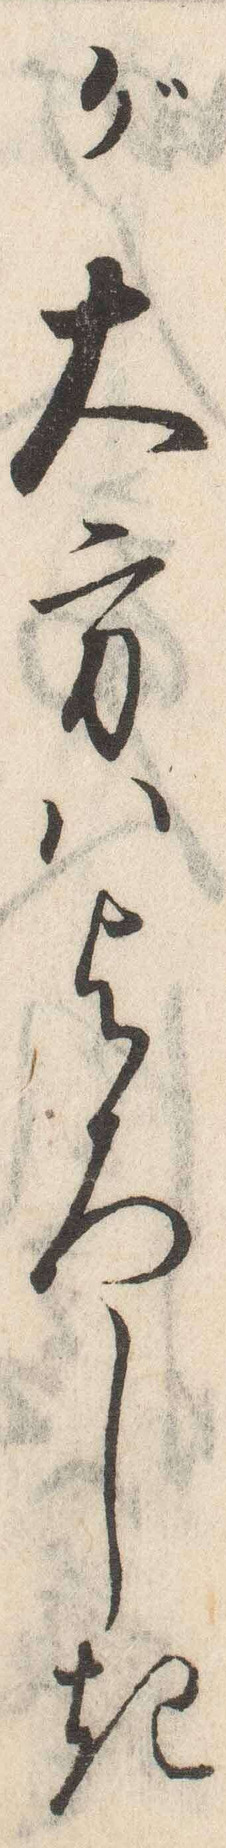が大方はよろしき
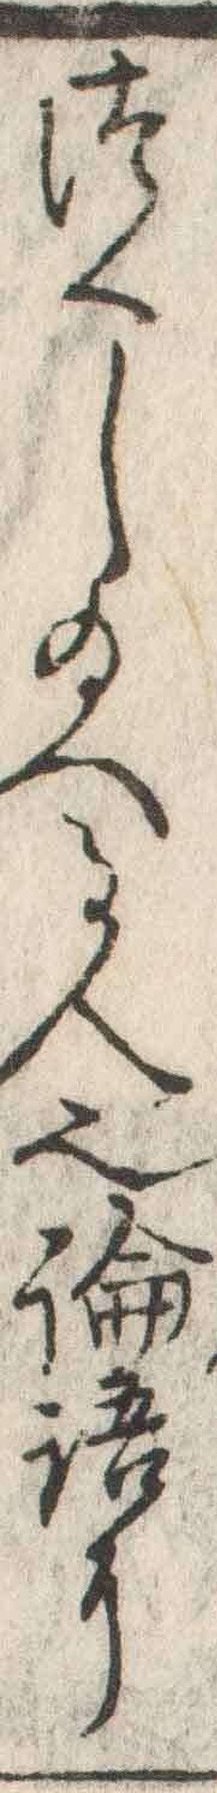つくし給へる人也論語に
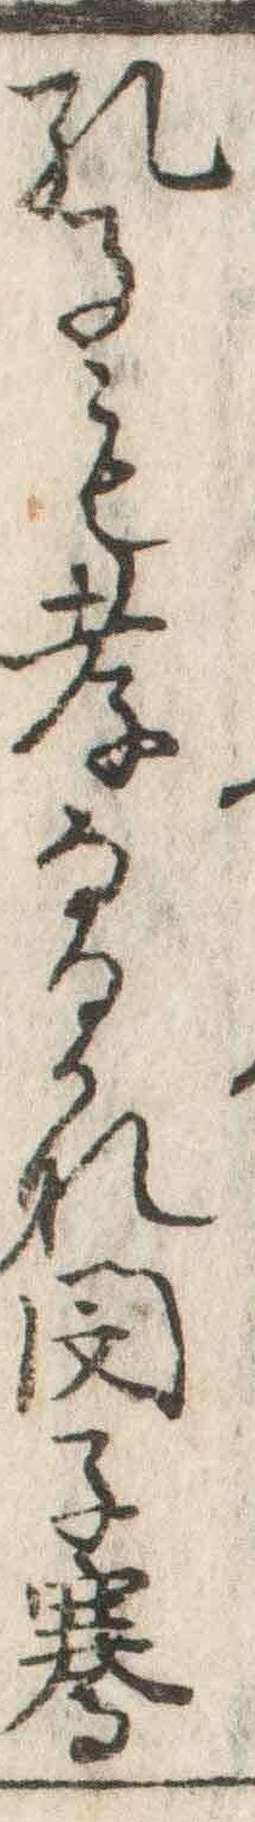孔子も孝なるかな閔子騫
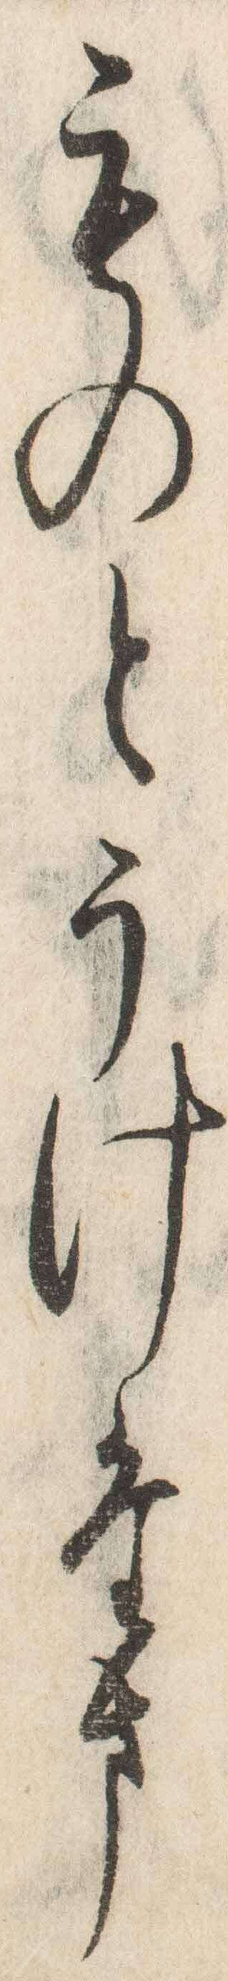ものとうけたま
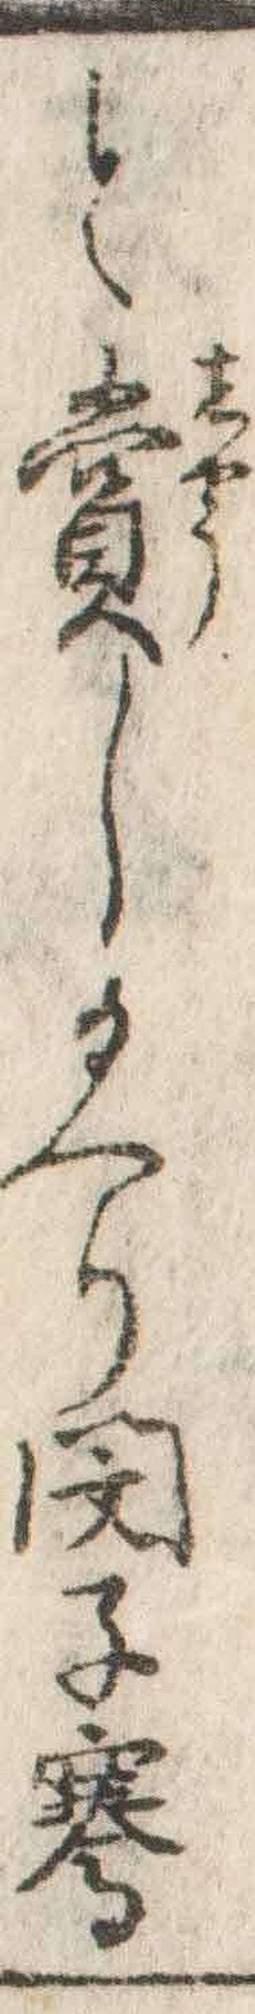と賞し給へり閔子騫
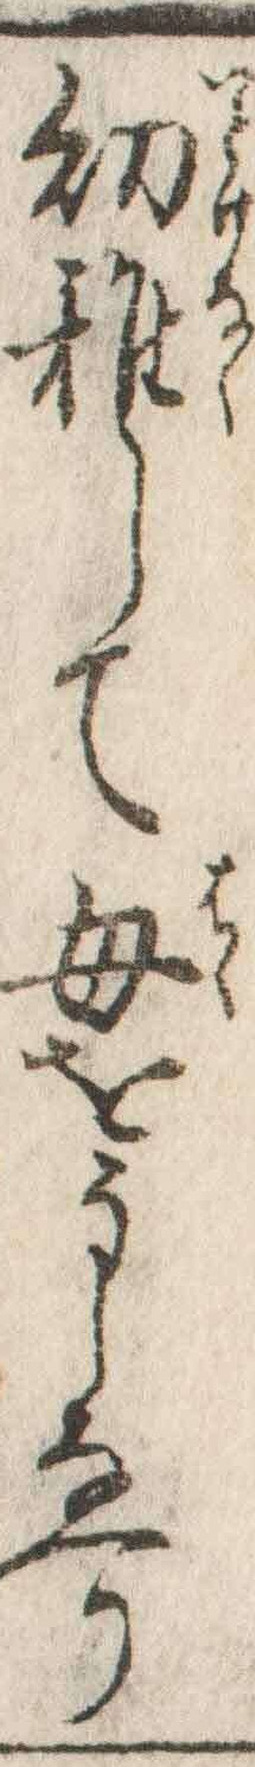幼稚して母をうしなへり
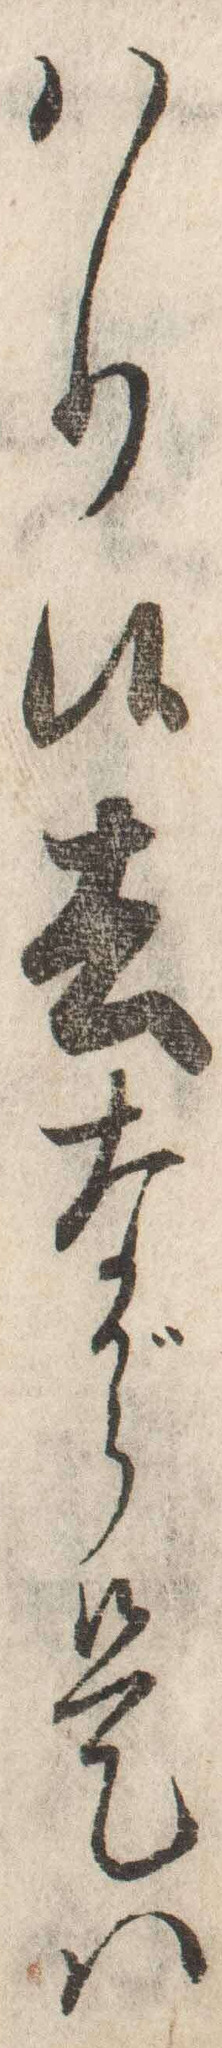はり候去ながら是は
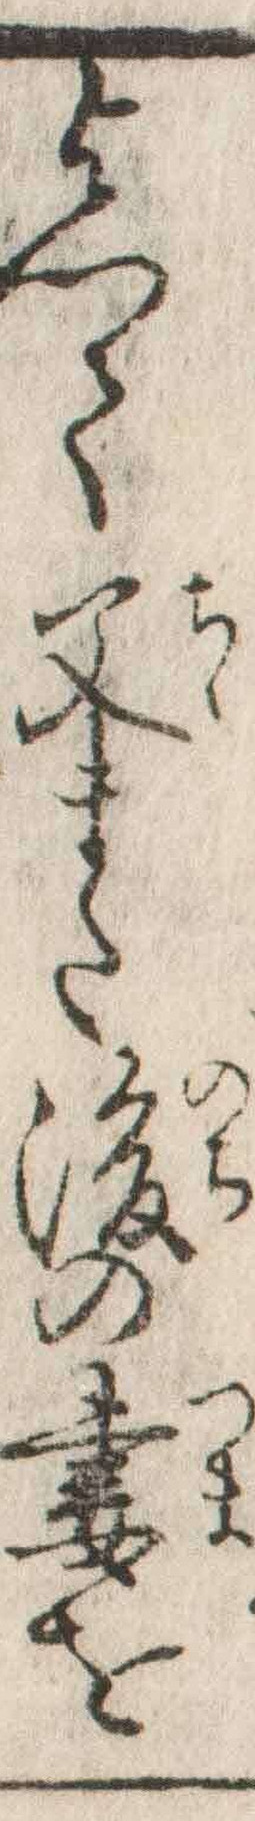よつて父また後の妻を
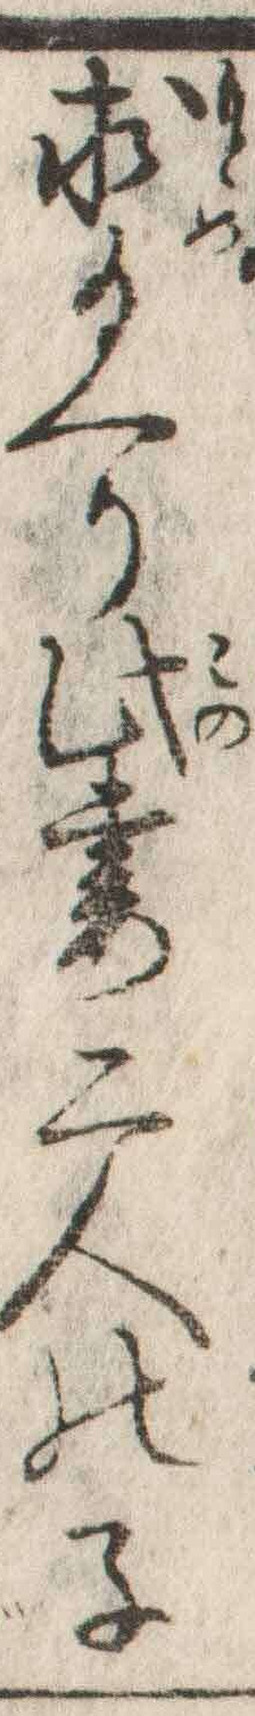求給へり此妻二人の子
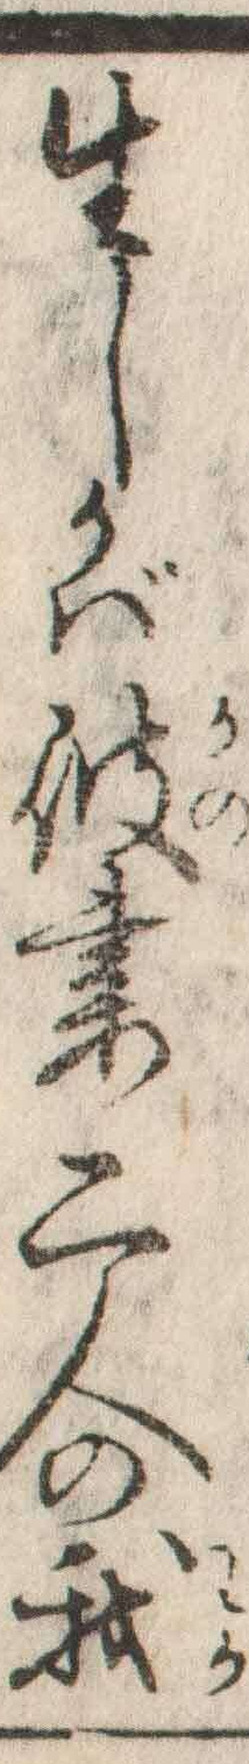生しかば彼妻二人の我
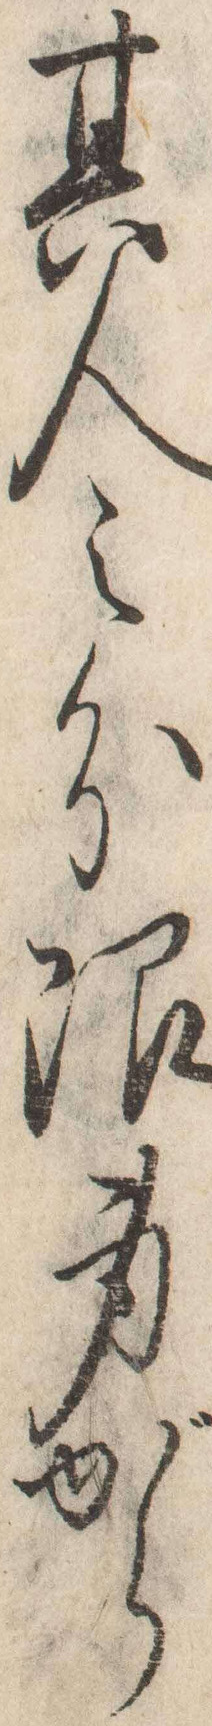其人之分限身がら

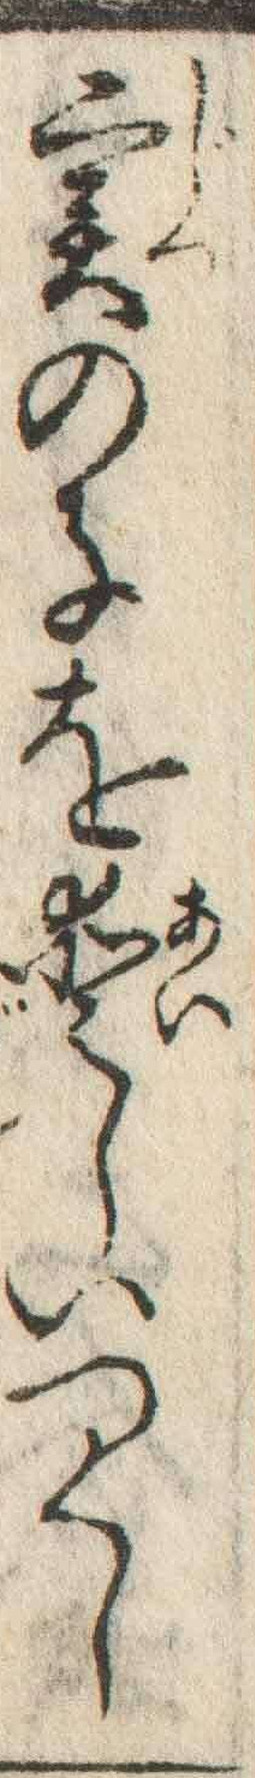実の子を愛しいつくし
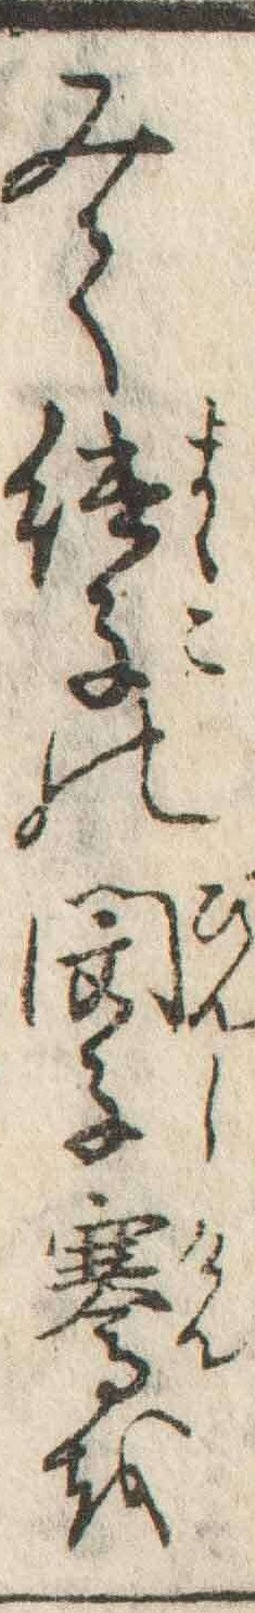みて継子の閔子騫を
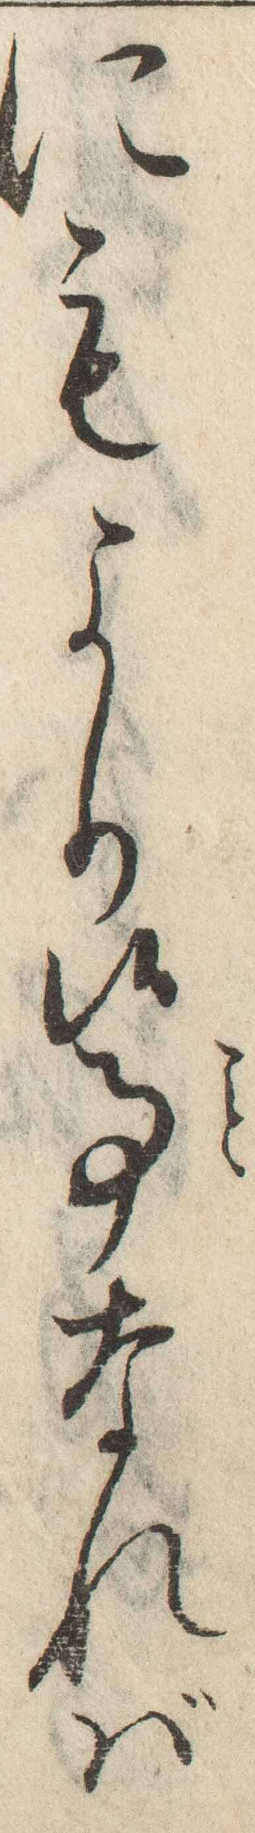にもより候事なれば
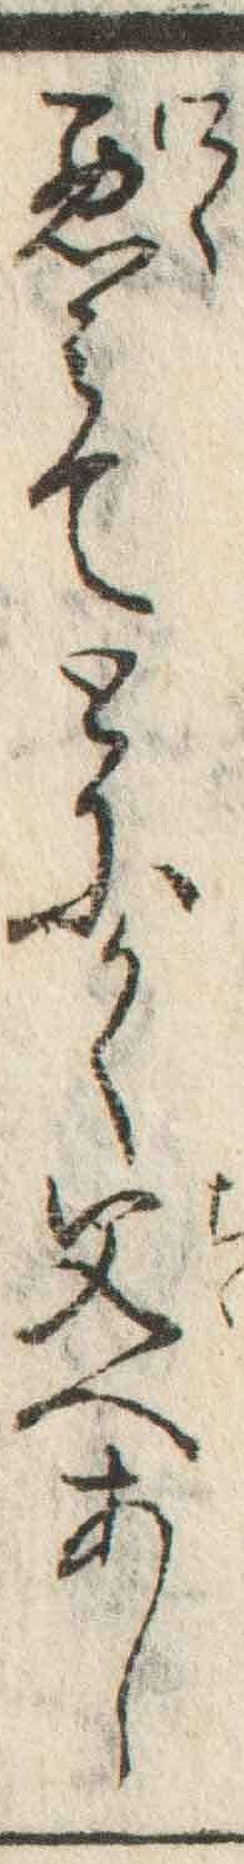悪みてとにかく父へあし
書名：撫育草
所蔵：東京学芸大学附属図書館 国文学研究資料館
